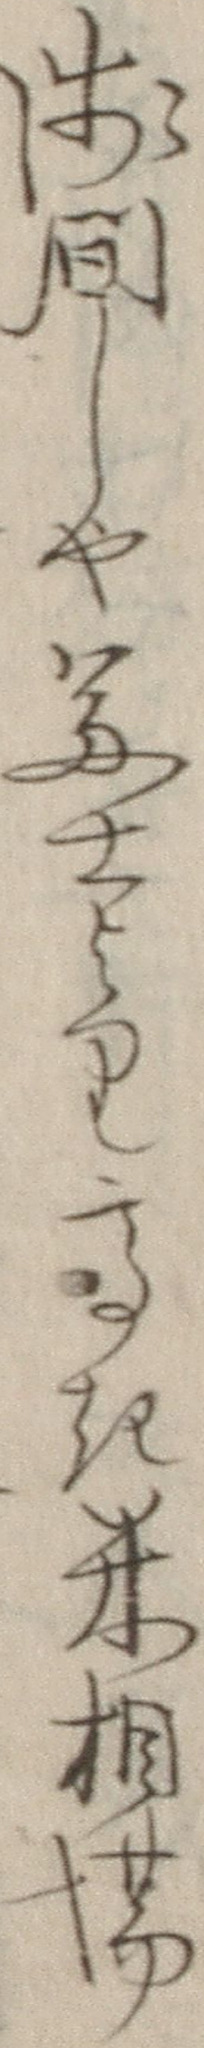浅間しや富士より高き米相場
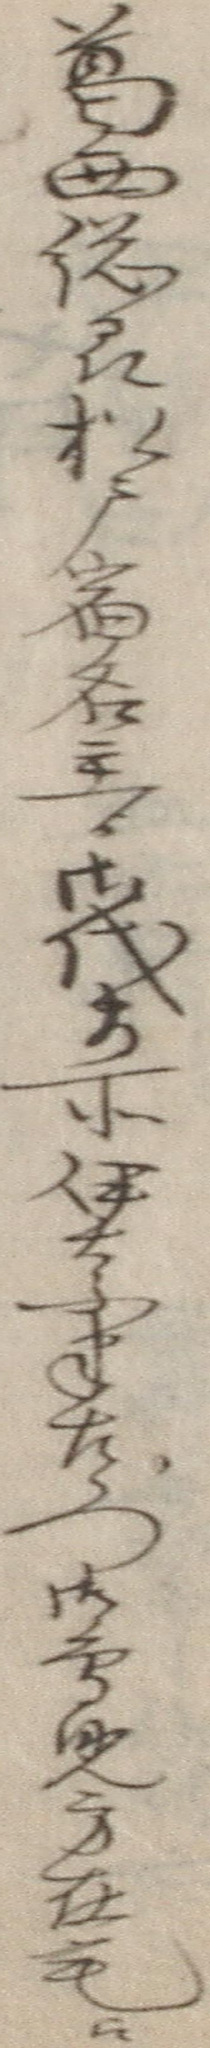葛西総州松戸宿名主ゟ御代官所伊奈半左衛門御鳥見方在宅え
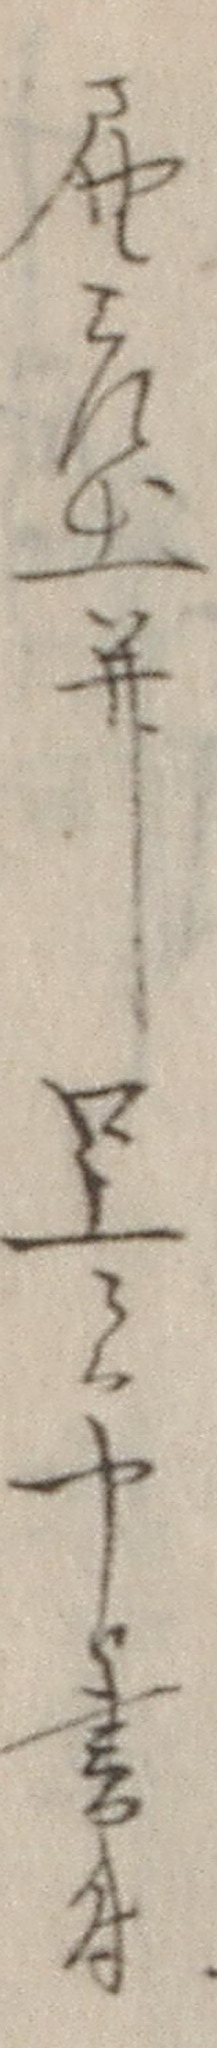届差出并口上ニ而申候書付
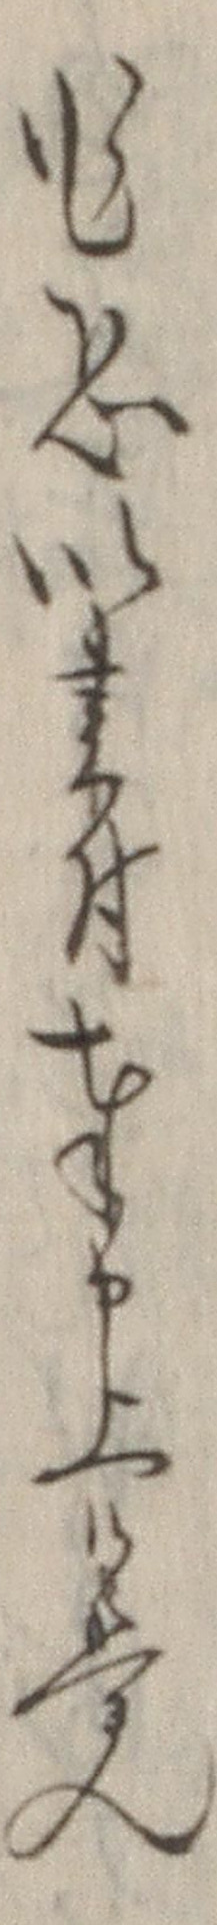乍恐以書付奉申上候覚
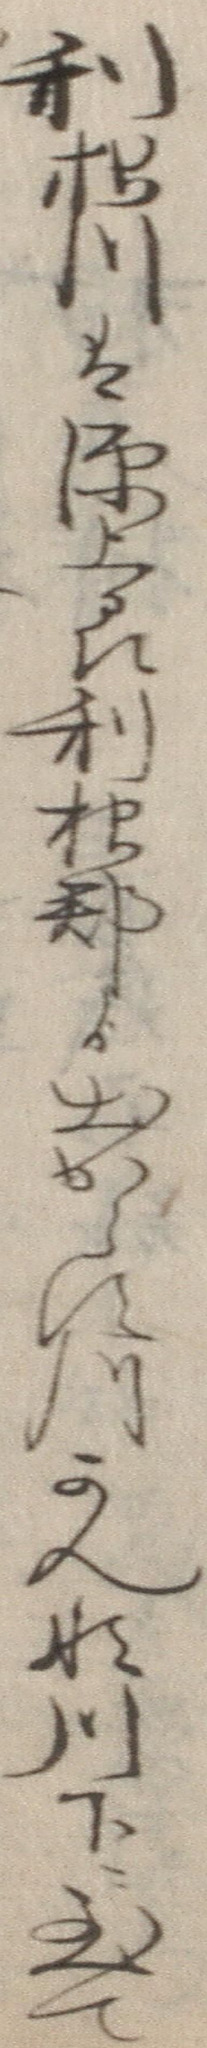利根川は源上州利根郡ゟ出からす川かんな川下ニ至て
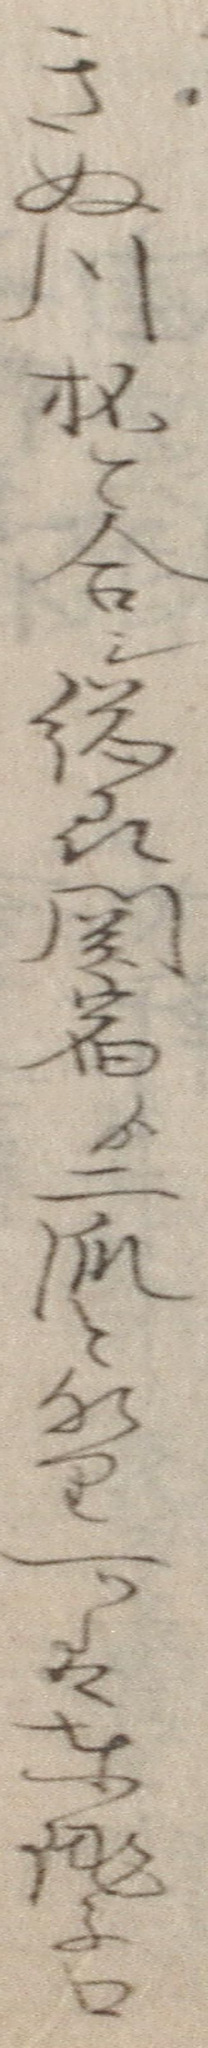きぬ川抔と合シ総州関宿ゟ二流となり一ツは東銚子口
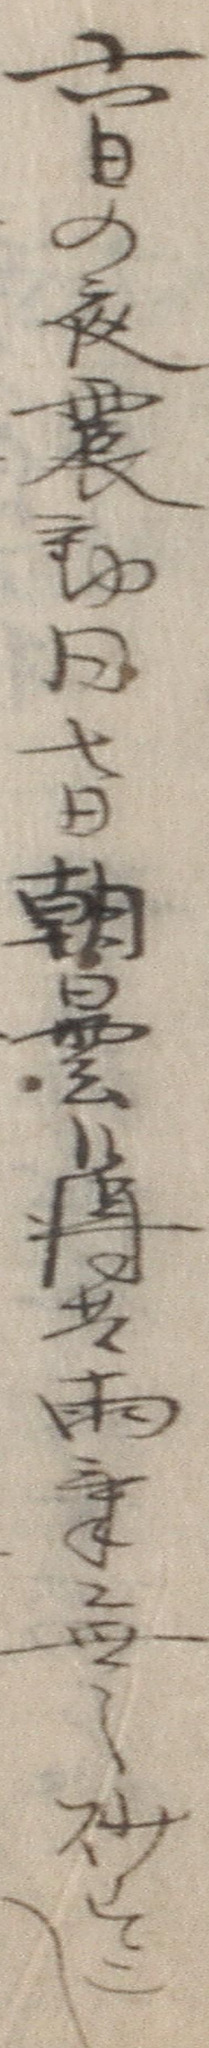六日の夜震動同七日朝曇候得共雨気無之砂すこし
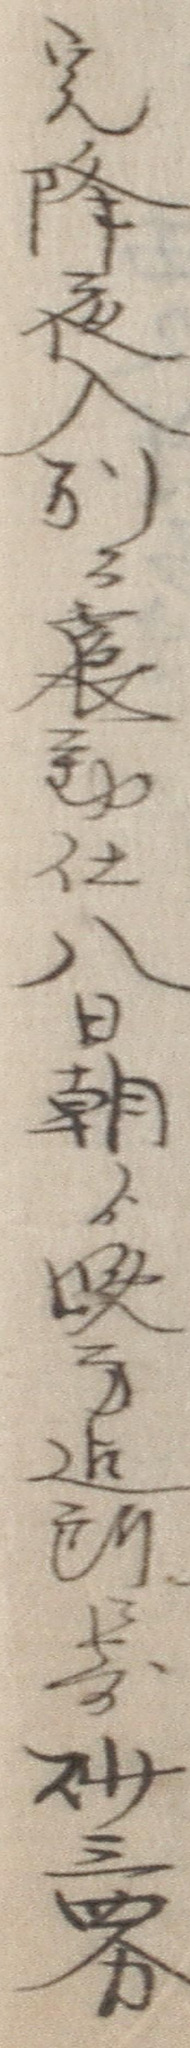完降夜入別而震動仕八日朝ゟ晩方迄所ニ寄砂三四分
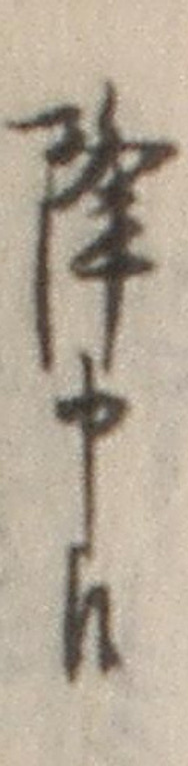降申候
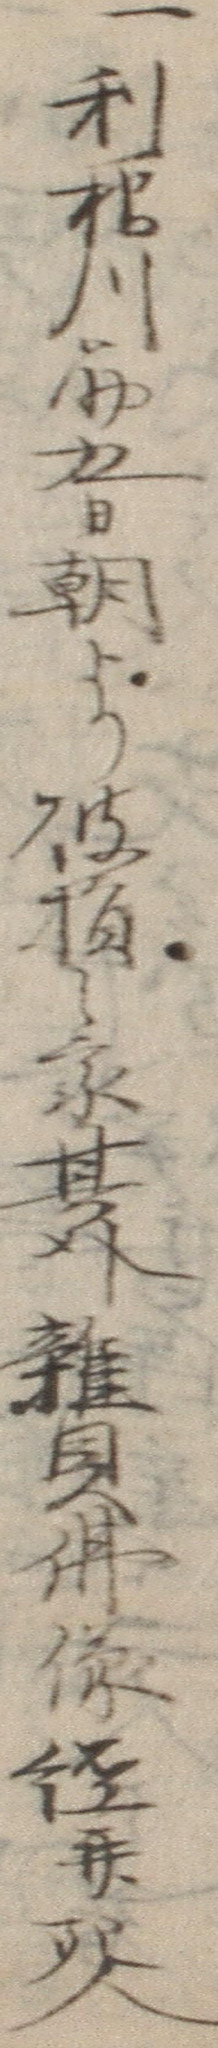一利根川筋九日朝より破損之家其外雑貝仏像経并死人
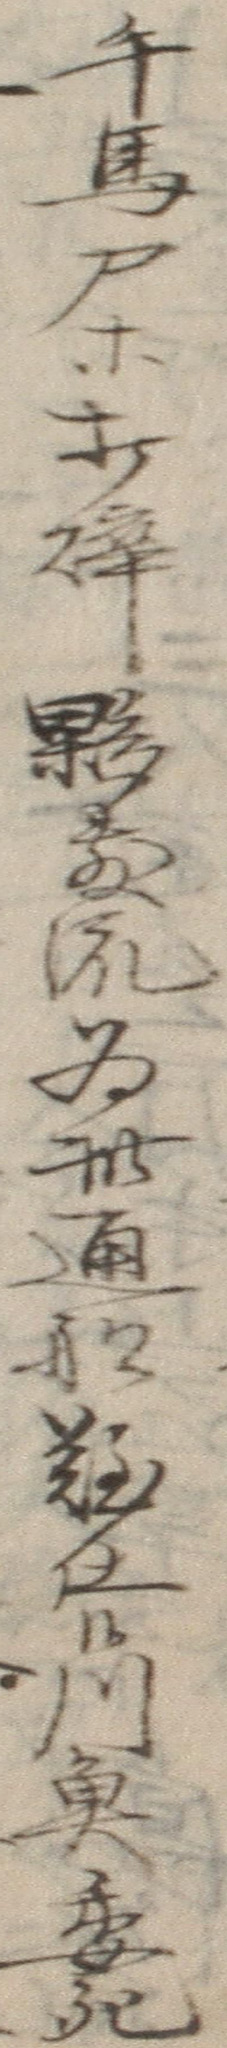牛馬戸等打砕夥敷流為此通舩難仕候川魚悉死
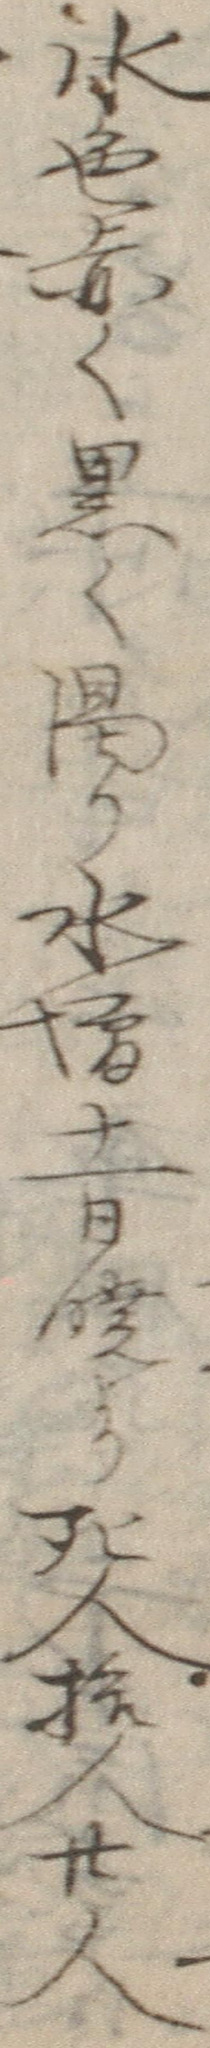水色赤く黒く渇り水増十一日暁より死人拾人廿人
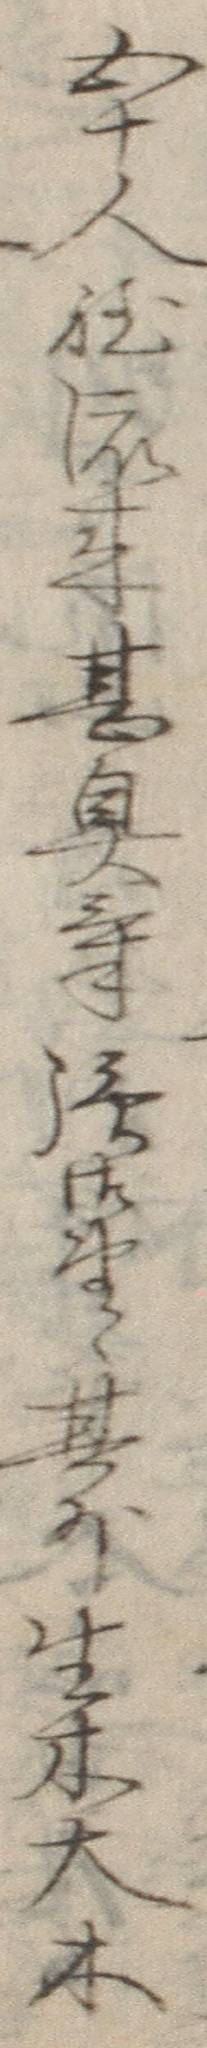五十人程流来甚臭気強御座候其外生木大木
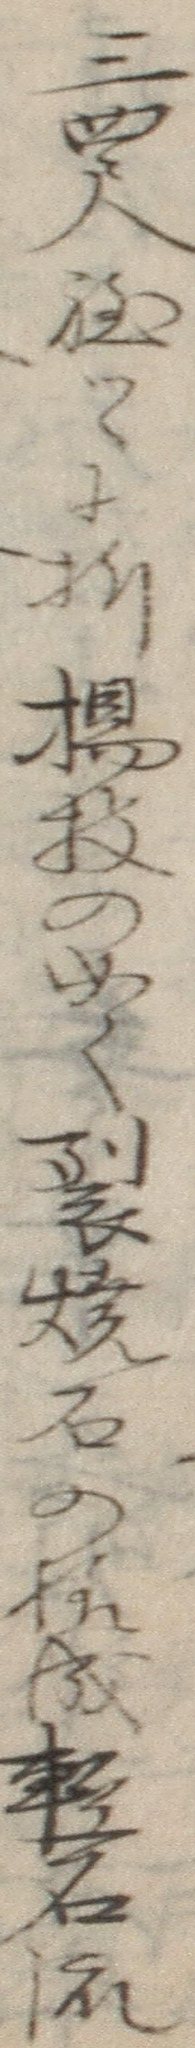三四尺程ツゝに折楊枝の如く裂焼石の様成軽石流
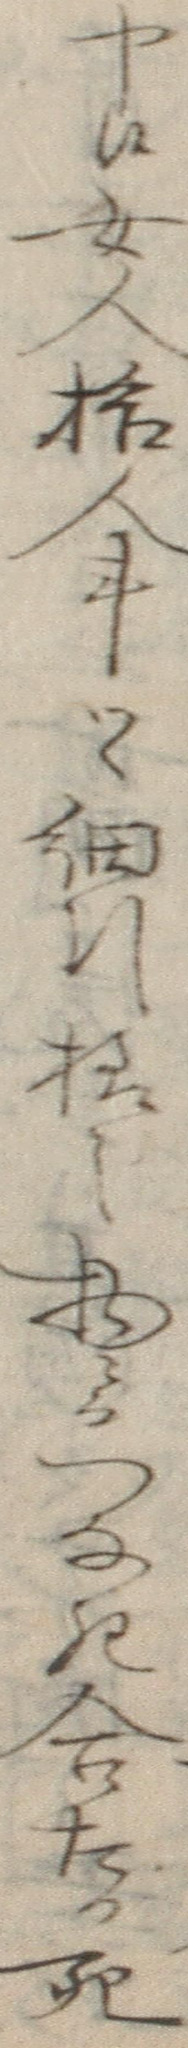申候女人拾人斗ツゝ細引様之物ニ而つなき合たる死
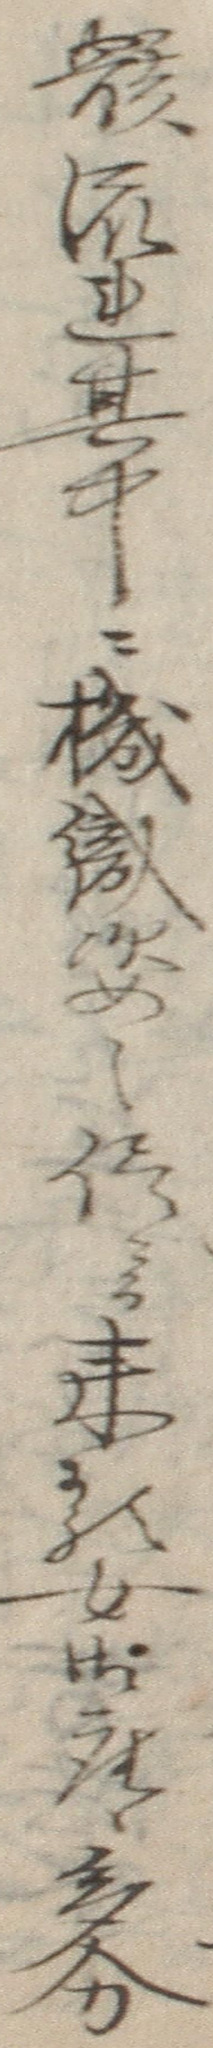骸流れ其中ニ機織姿之侭ニ而来る女御座候多分
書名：[諸国災害記録]
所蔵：東京大学地震研究所図書室 Earthquake Research Institute Library, The University of Tokyo, JAPAN
